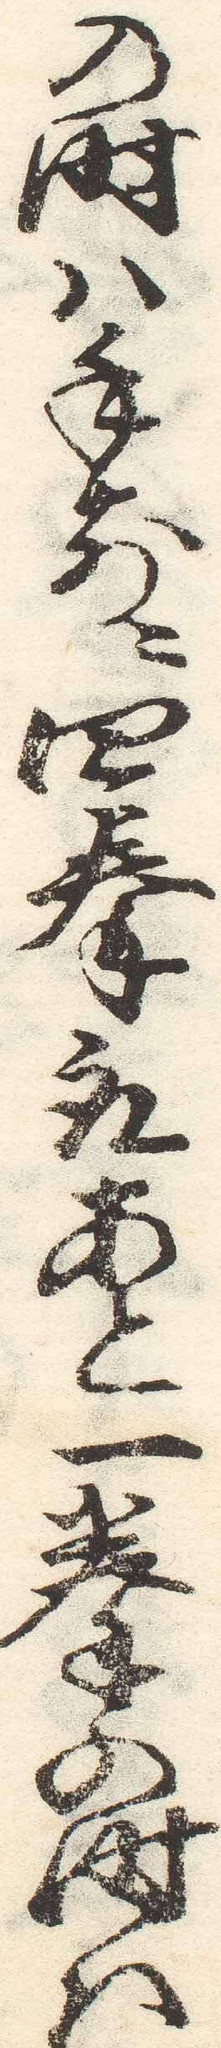の時は手前に四拳取あと一拳の時は
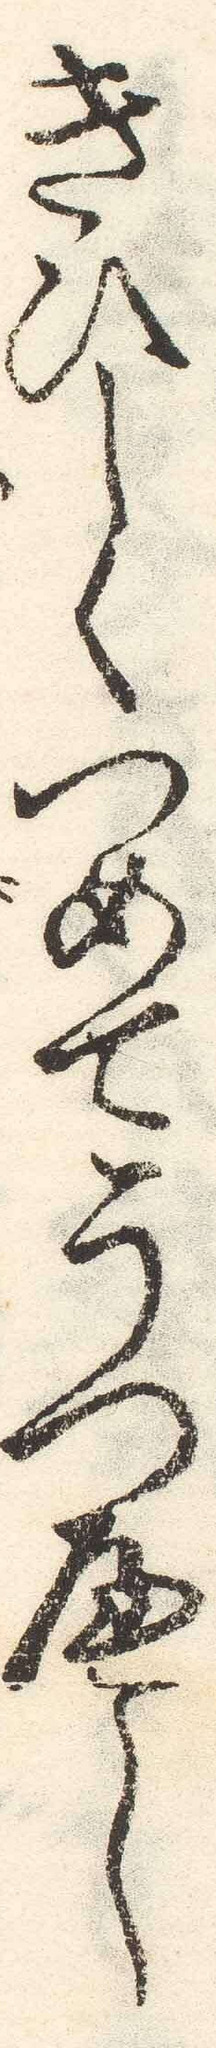きひしくつめてうつへし
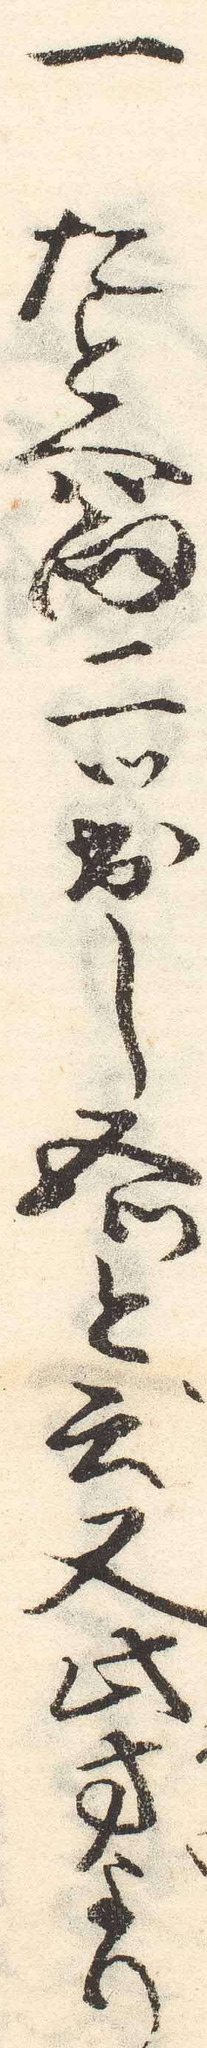一たとへは向二つ出し五つと云又此方より
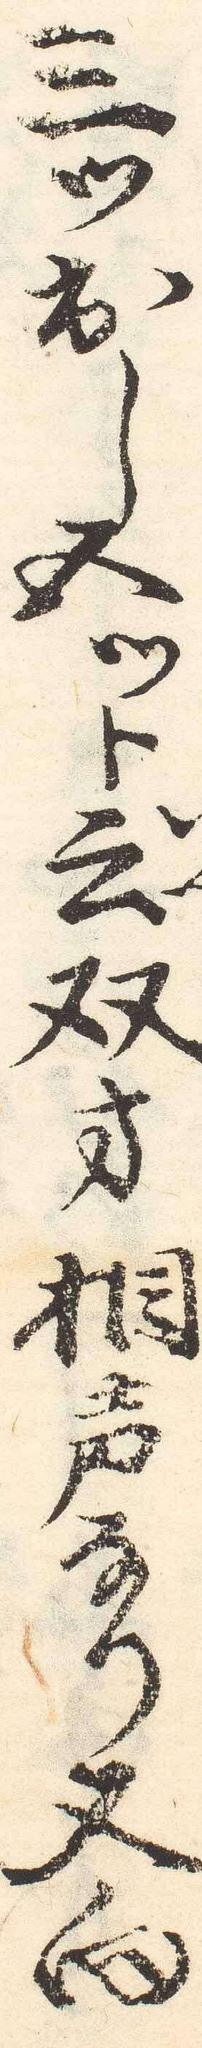三つ出し五つと云双方相声なり又向
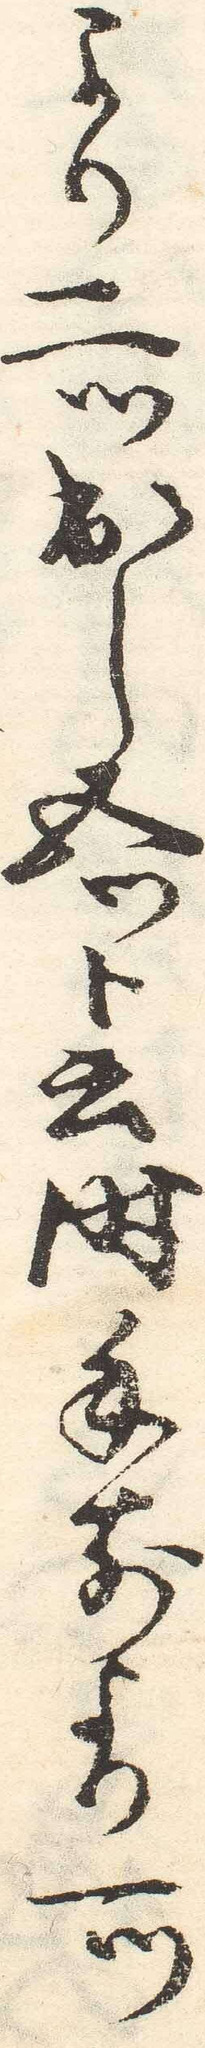より二つ出し五つと云時手前より一つ
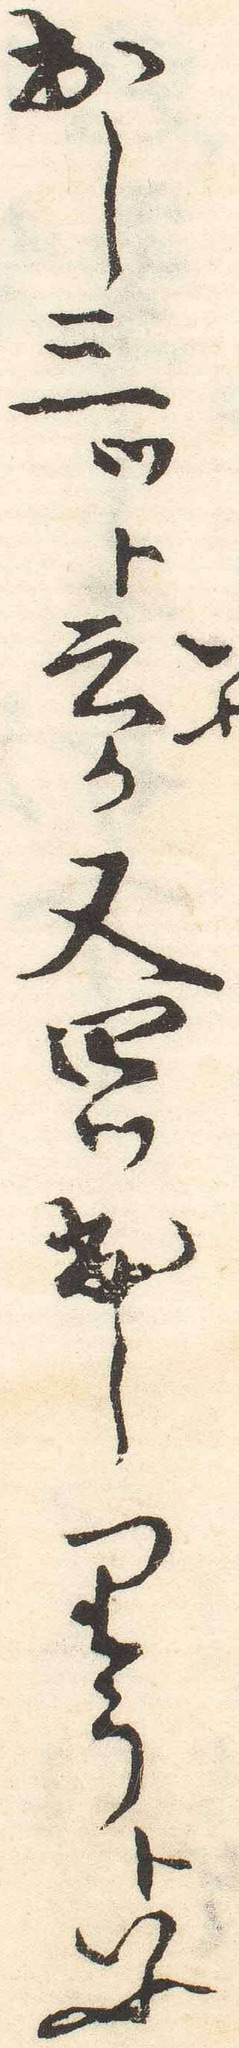出し三つと云か又四つ出しりうといふ
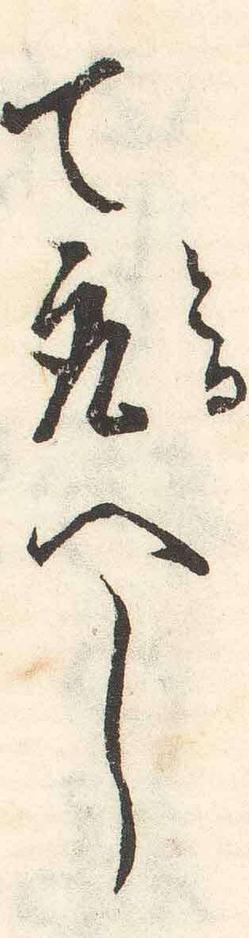て取へし
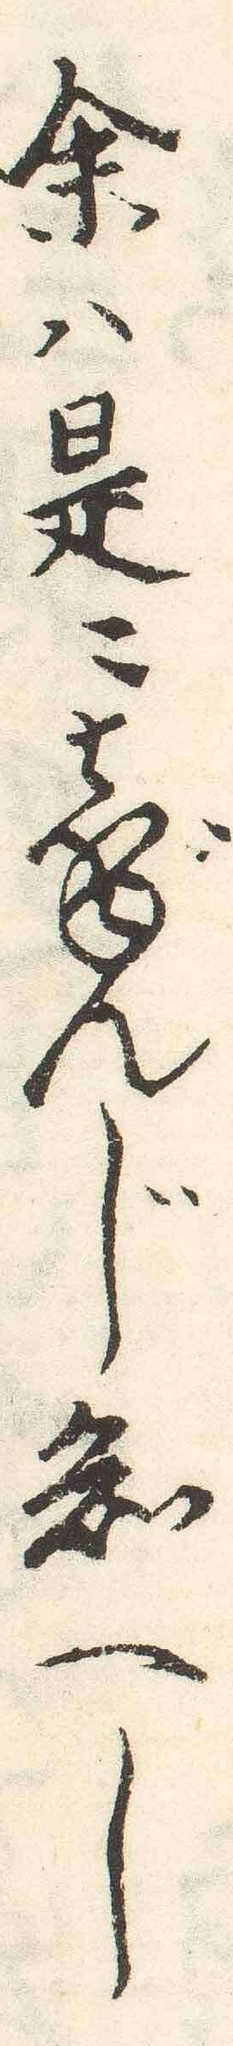余は是にじゆんじ知へし
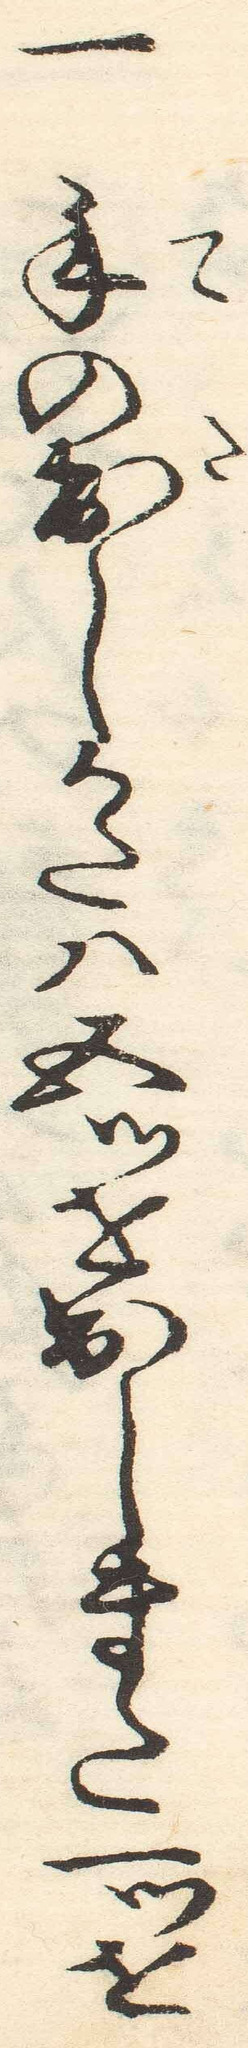一手の出しかたは五つを出しまた一つを
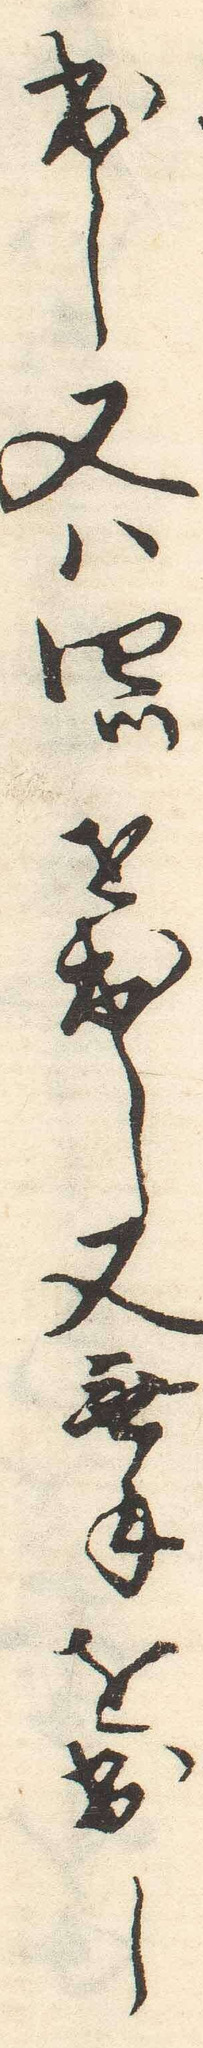出し又は四つを出し又無手を出し

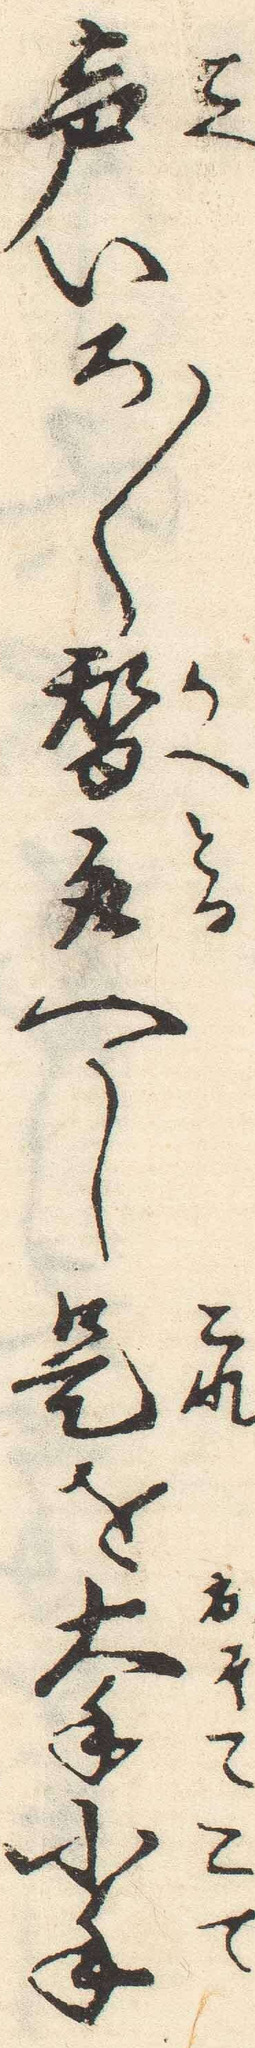声いろ〳〵替取へし是を大手小手
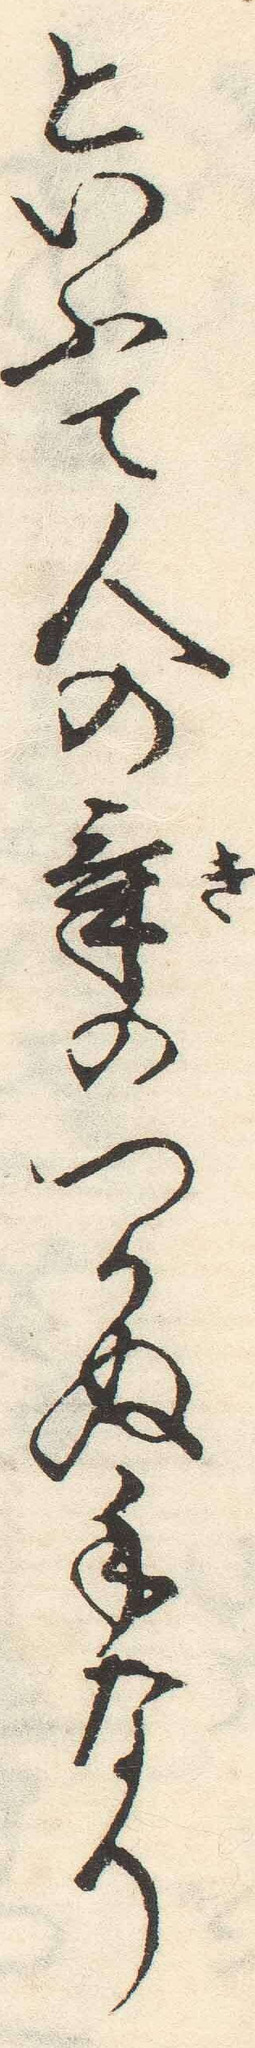といふて人の気のつかぬ手なり
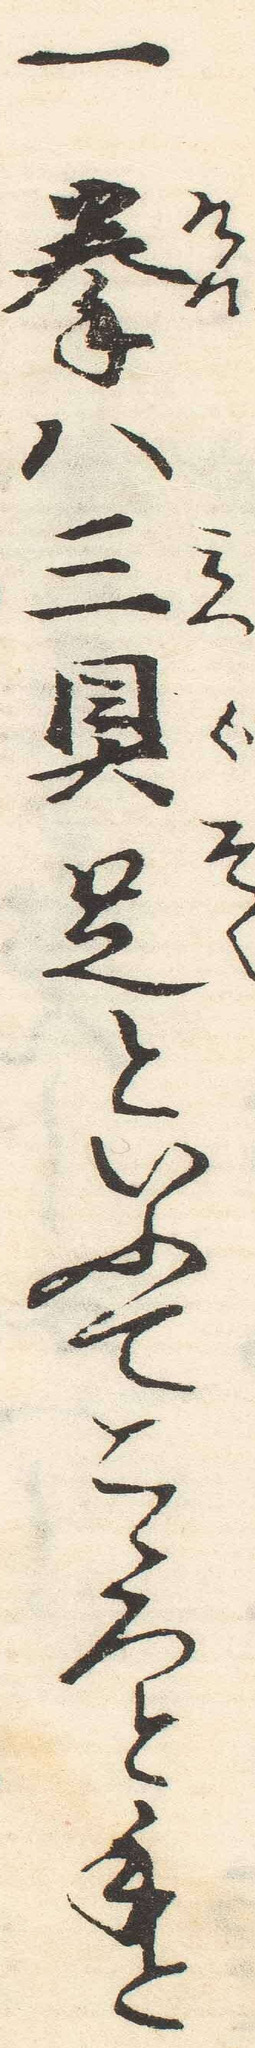一拳は三具足といふてこゝろと手と
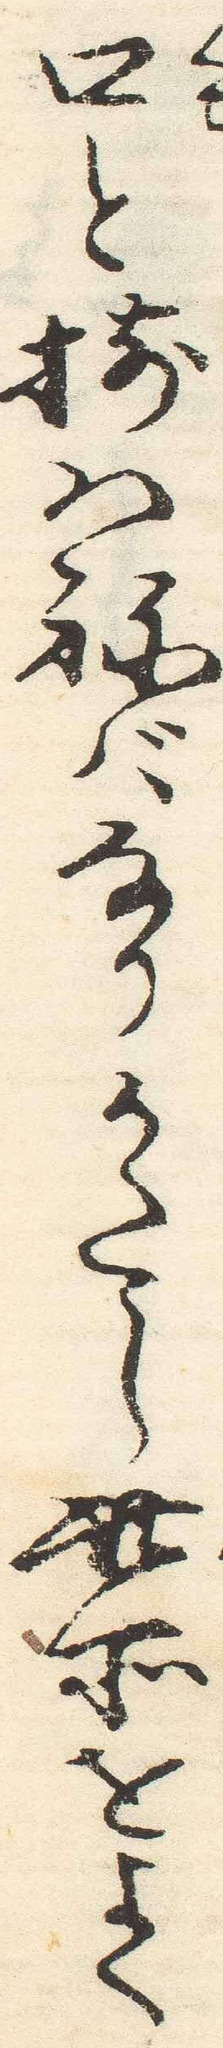口と揃はねばなりかたし此所をよく
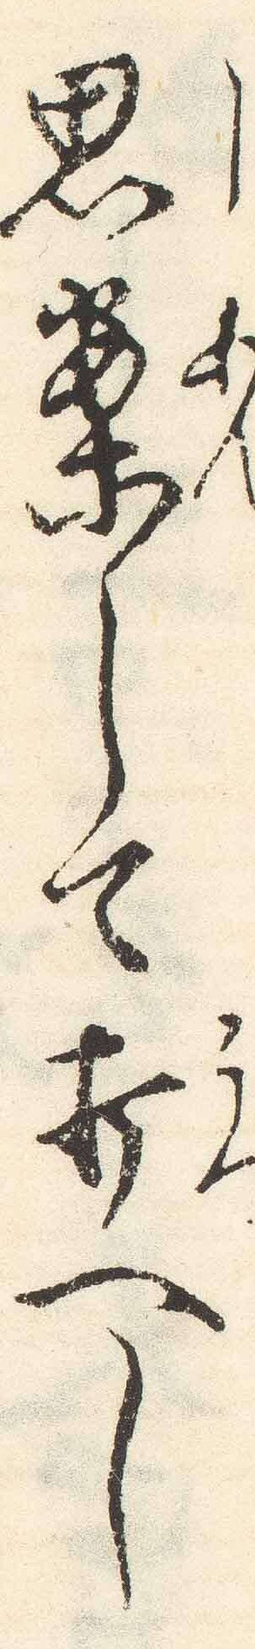思案して打へし
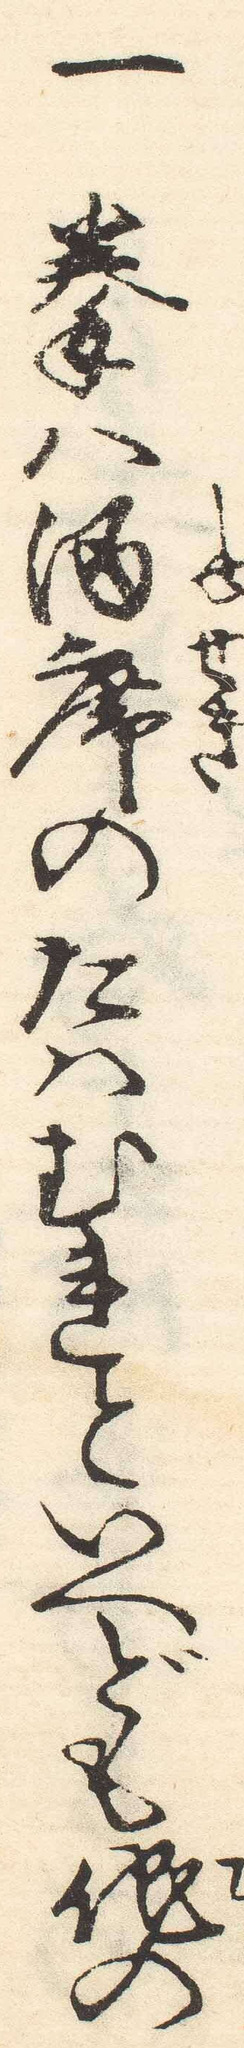一拳は酒席のたはむれといへども他の
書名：拳独稽古
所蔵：東京学芸大学附属図書館 国文学研究資料館
